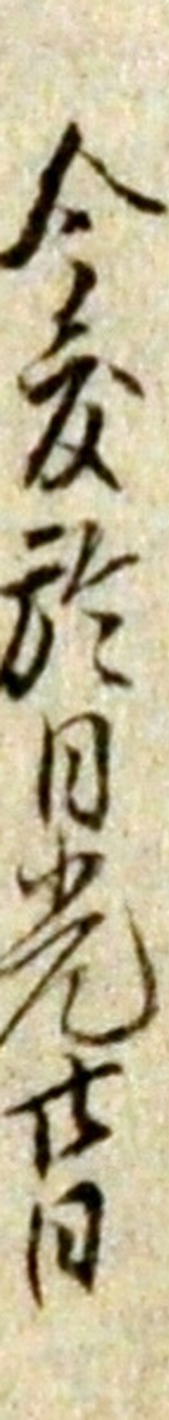今度於日光廿日
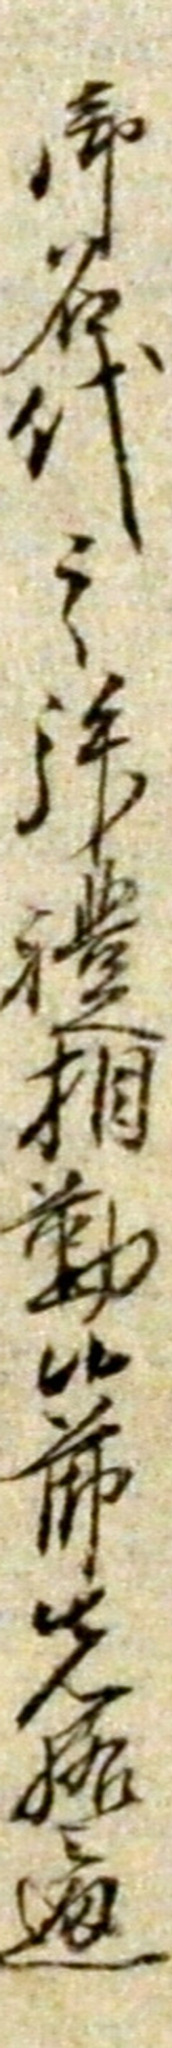御名代之拝礼相勤候節先格之通
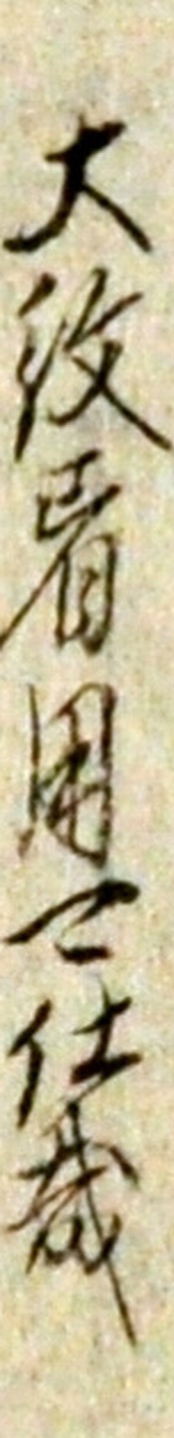大紋着用可仕哉
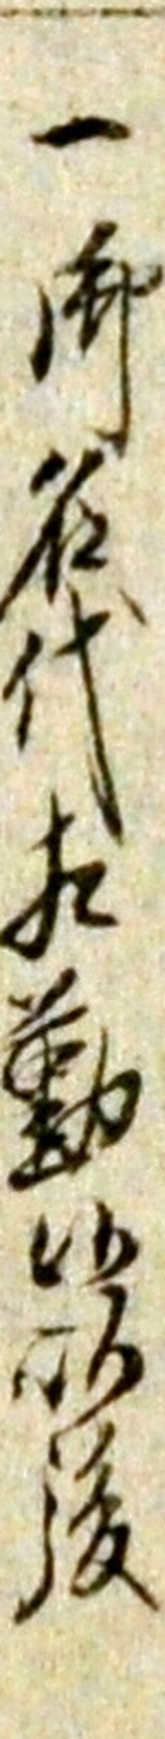一御名代相勤候以後
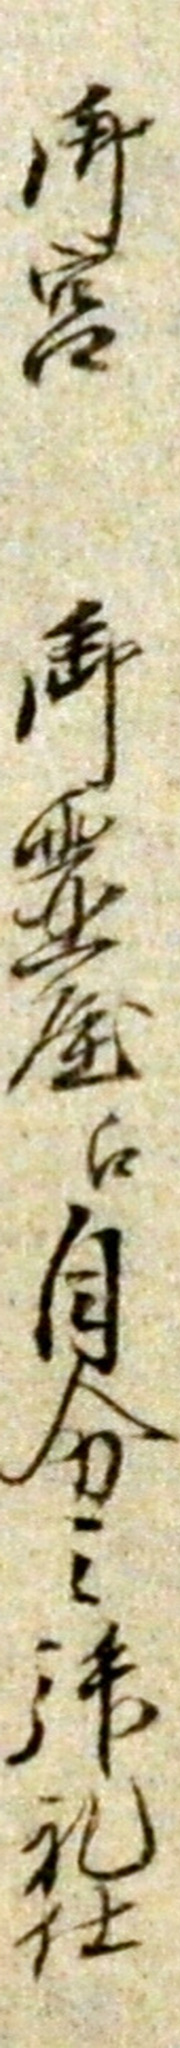御宮御霊屋江自分之拝礼仕
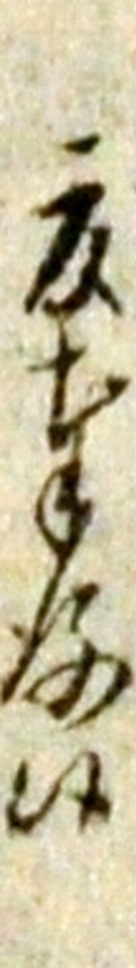度奉存候
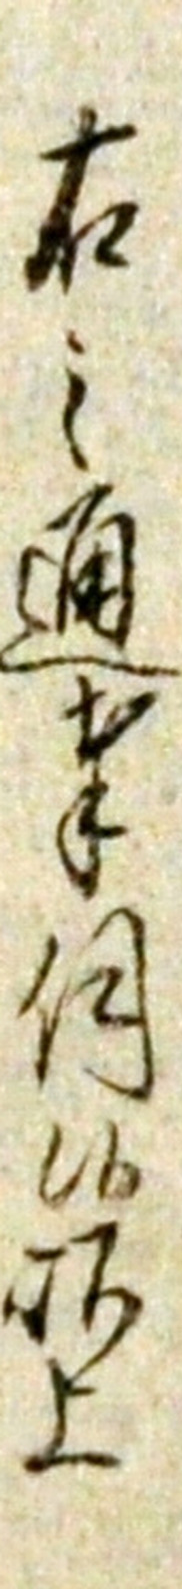右之通奉伺候以上
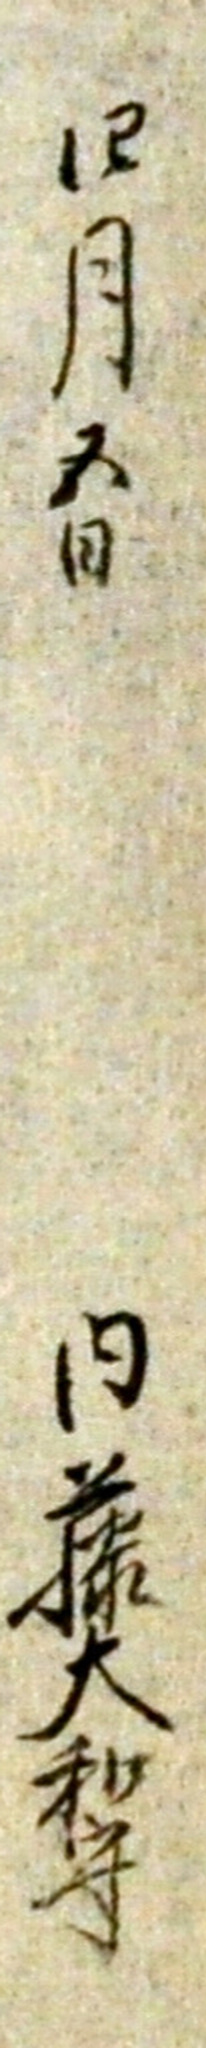四月五日内藤大和守
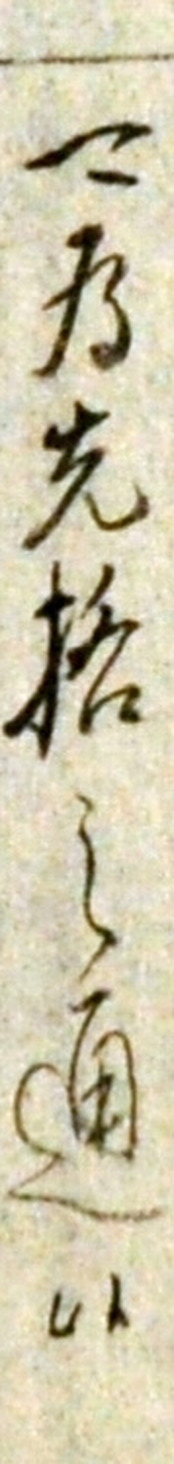可為先格之通候
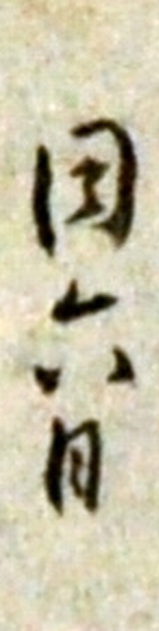同六日
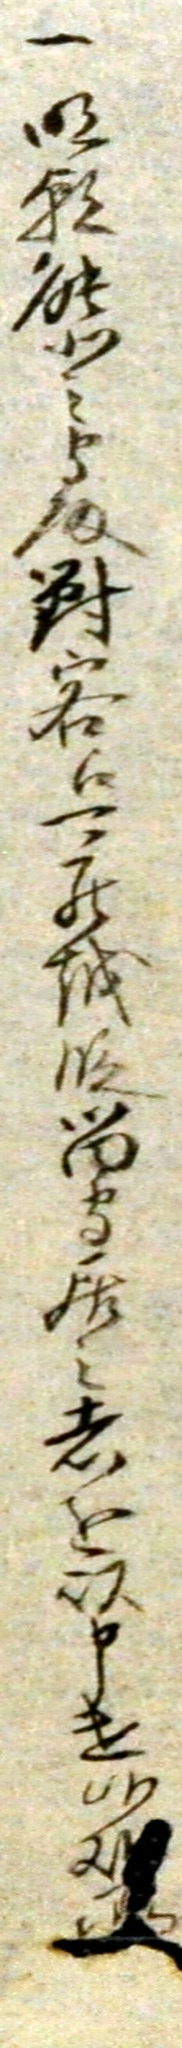一明朝能登守殿対客江可罷越段留守居之者を以申遣候処為
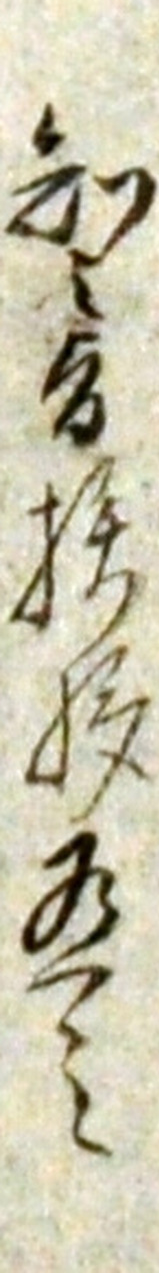承知之旨挨拶有之
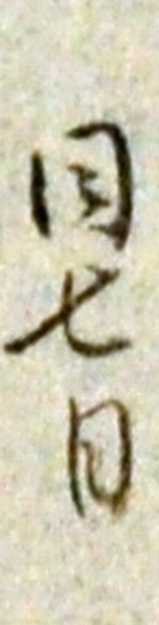同七日

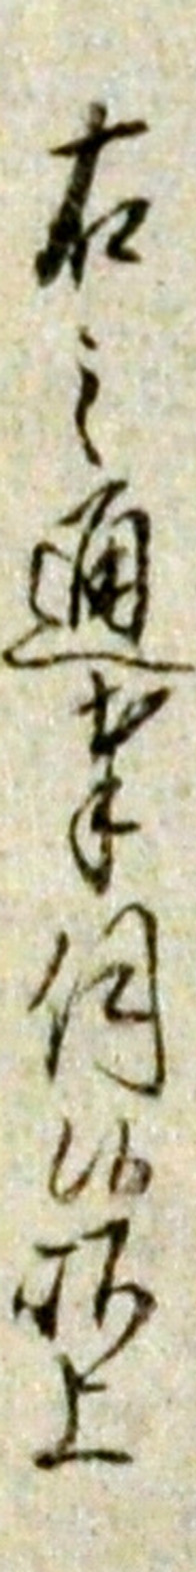右之通奉伺候以上
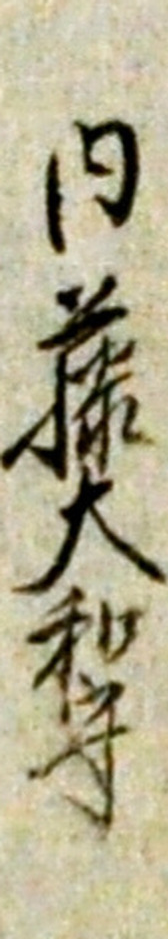内藤大和守殿
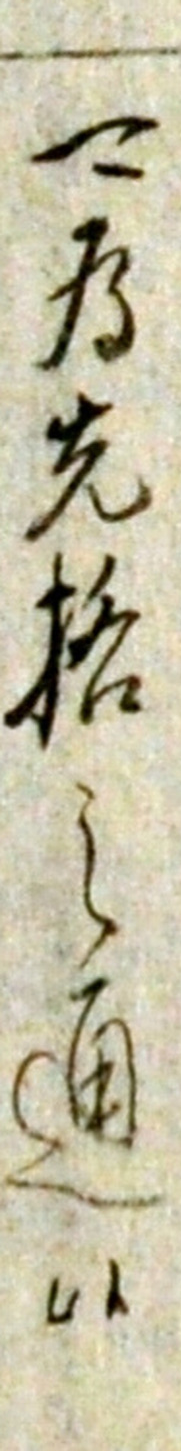可為先格之通候
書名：日光御名代相勤候節ノ留
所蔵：伊那市立高遠町図書館・合同会社AMANE
